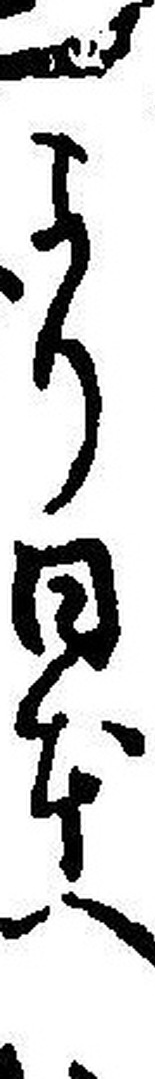より日本へ
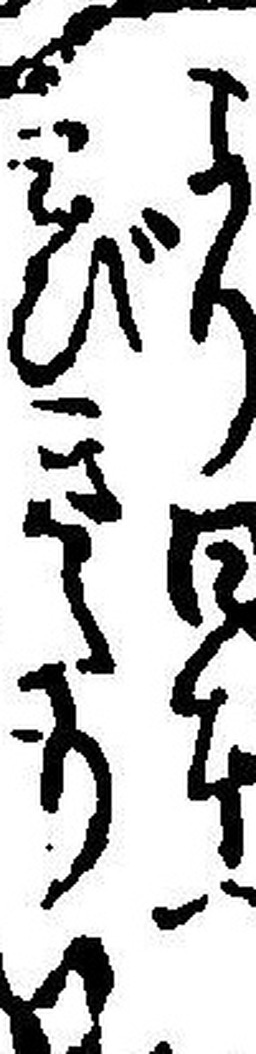とびきたり
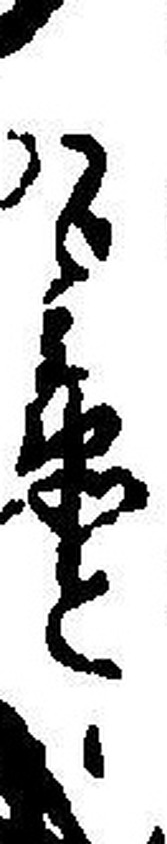八郎兵衛と
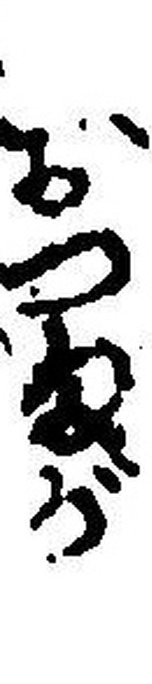おつねが
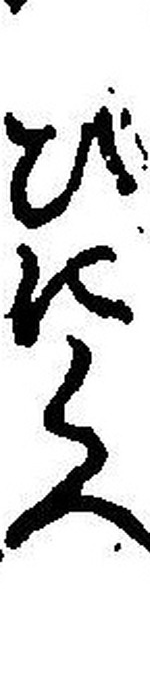ひにくへ
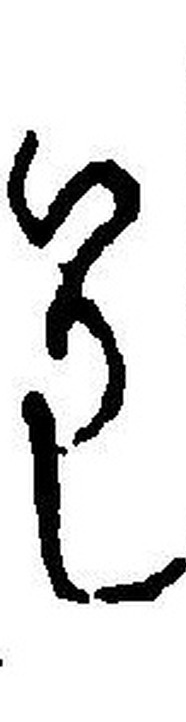いりし
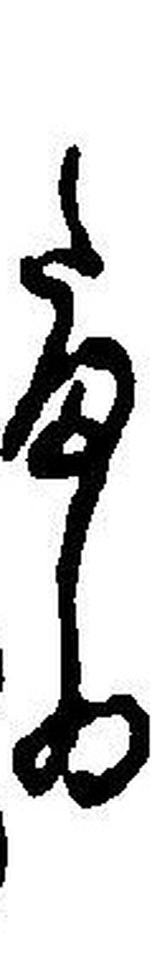たましゐ

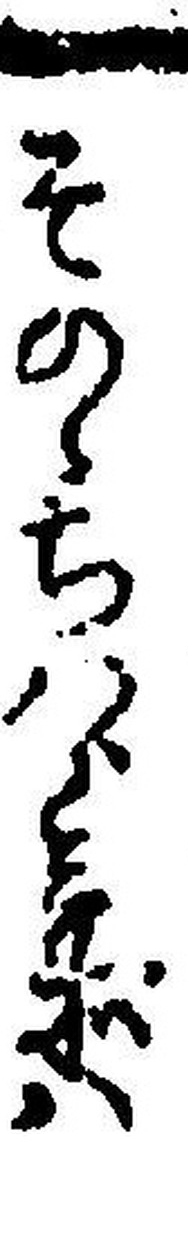そのゝち八郎兵衛は
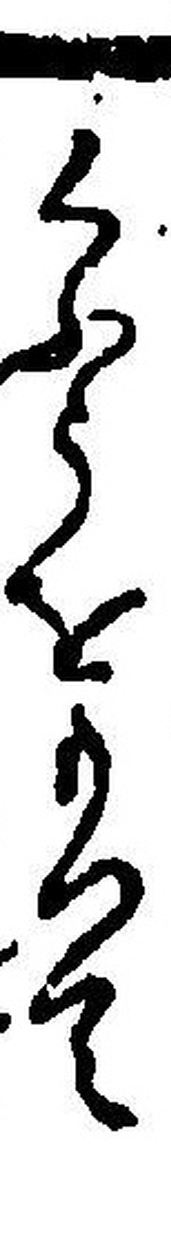くふうをもつて
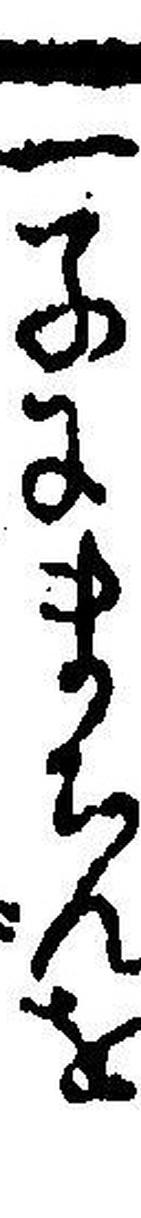一子にまちんを
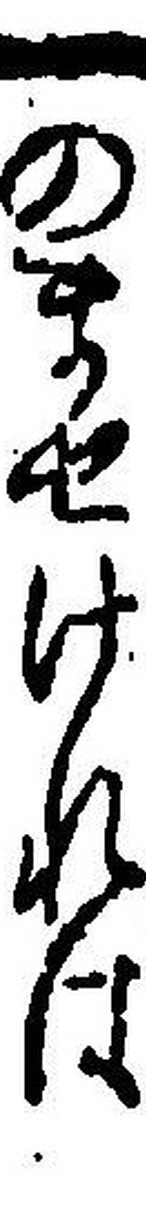のませければ
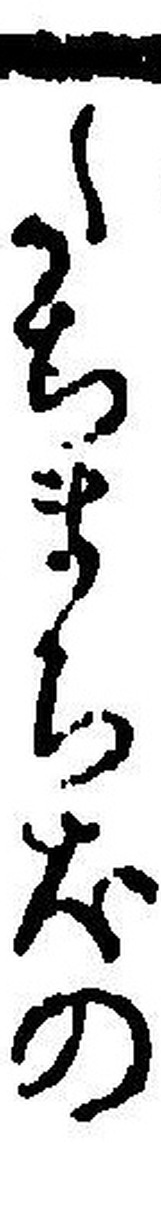たちまち犬の
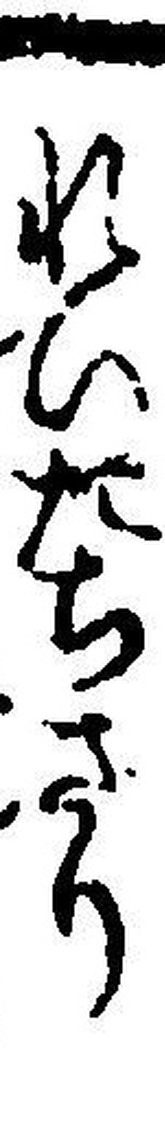れいたちさり
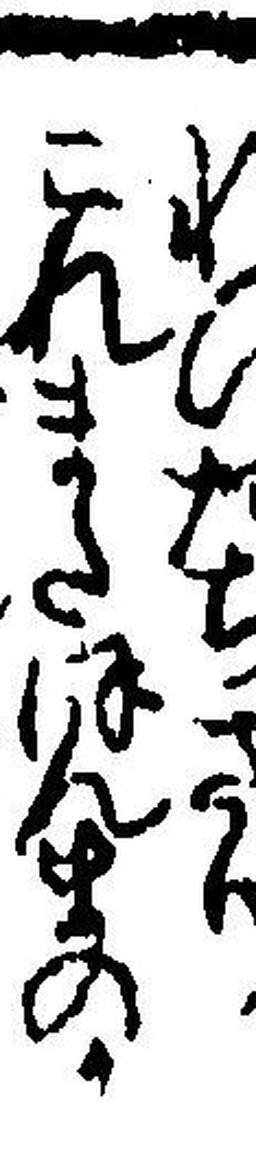これまたほんまの
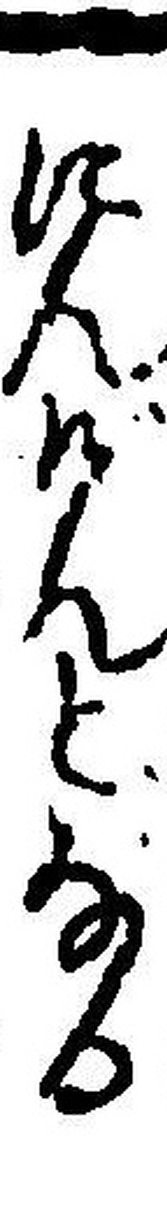にんげんとなる
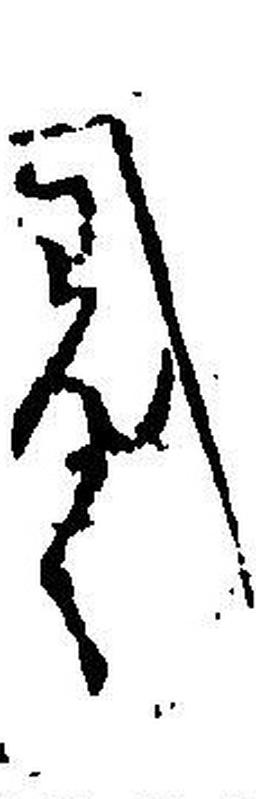〽わん〳〵
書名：花芳野犬斑 / 山東京伝作
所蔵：東京大学総合図書館 General Library in the University of Tokyo, JAPAN
